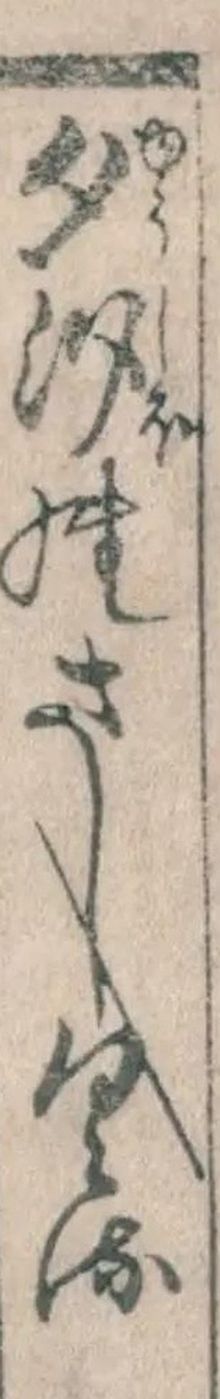夕汐のさしくる
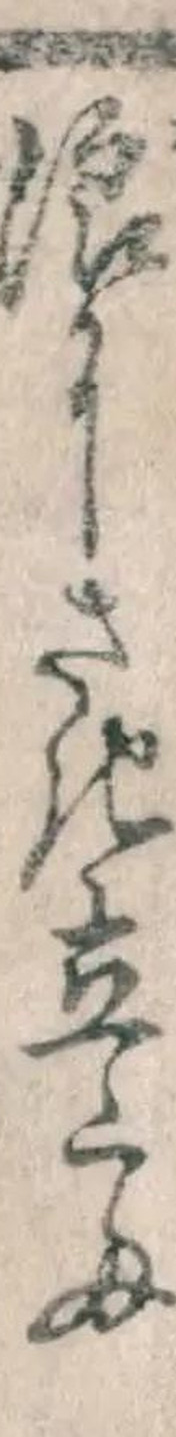浪にさき立て
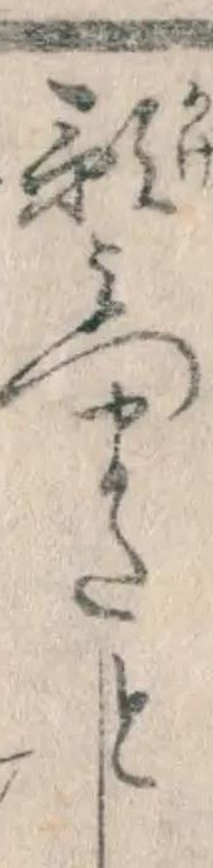影みつまたと
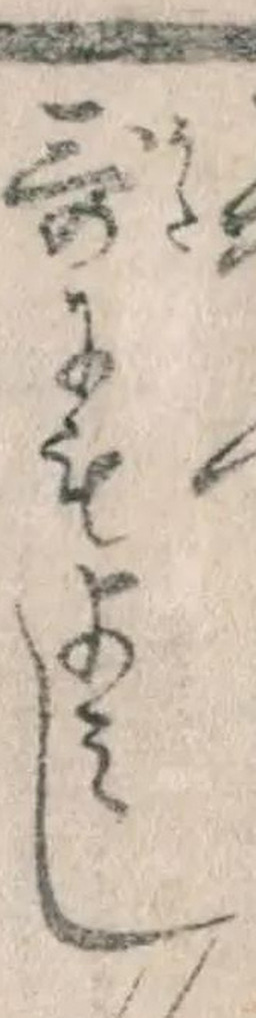歌にもよみし
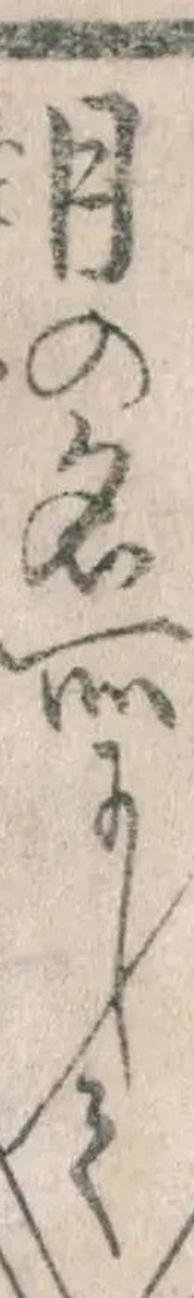月の名所にして
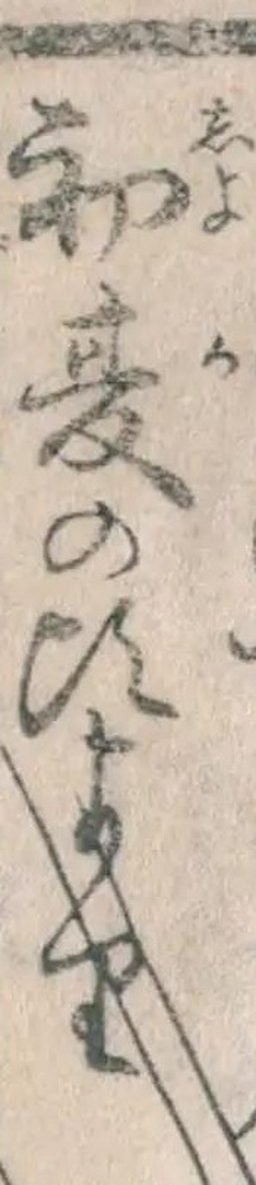初夏の頃より
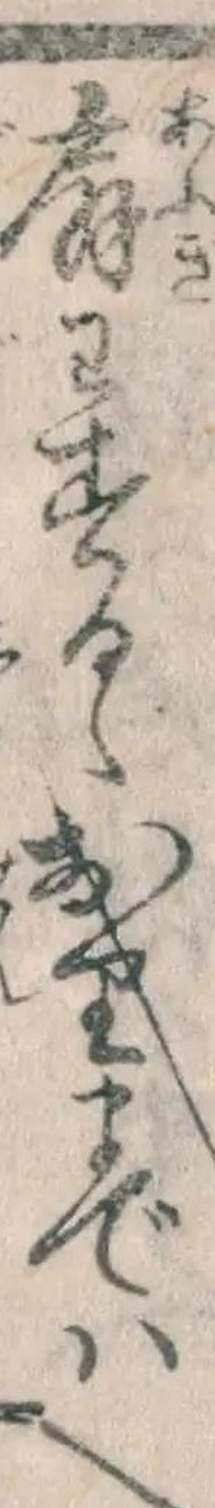扇わするゝおりまでは
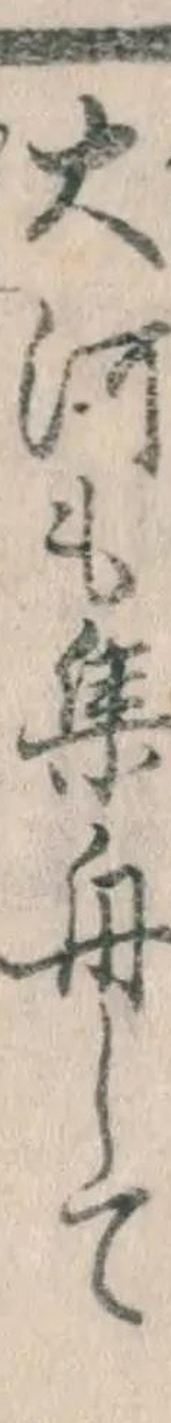大河も集舟して
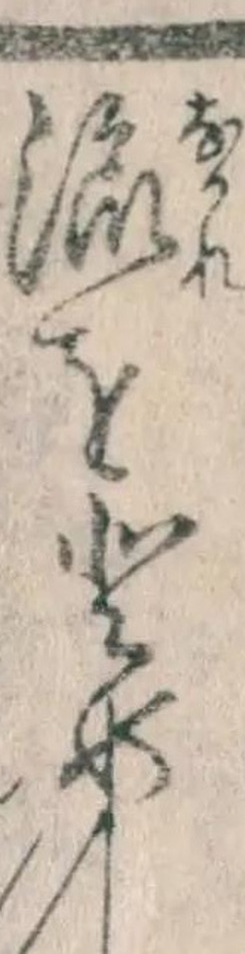流をとめ
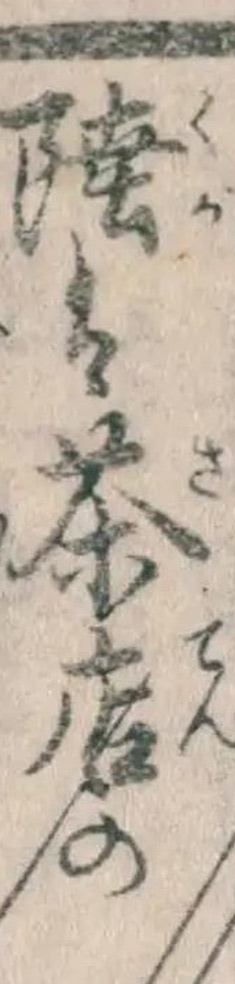陸は茶店の
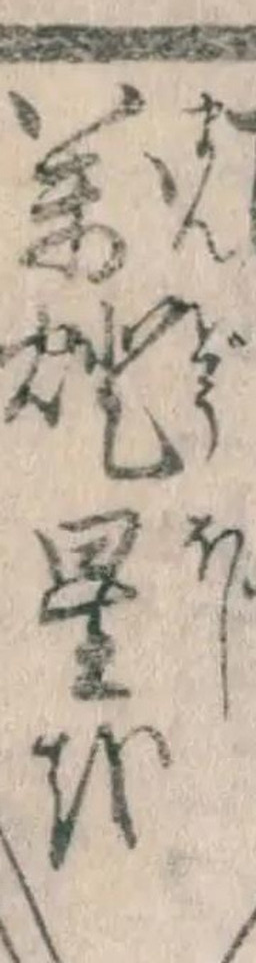万燈星を
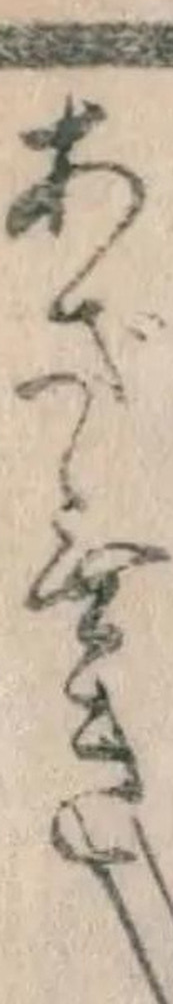あざむき
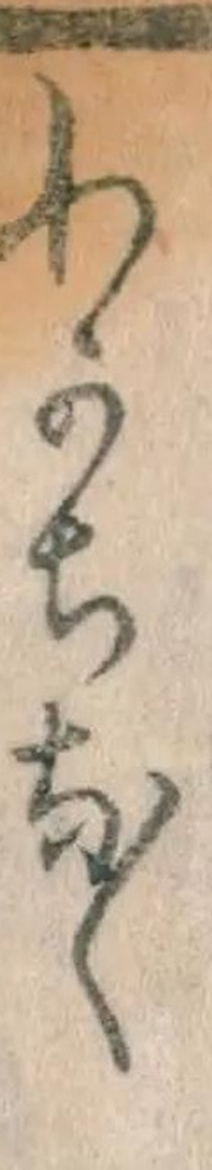わかちなく
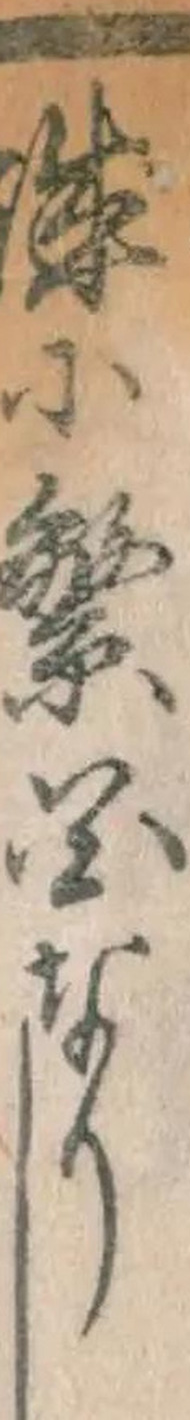誠に繁花なり
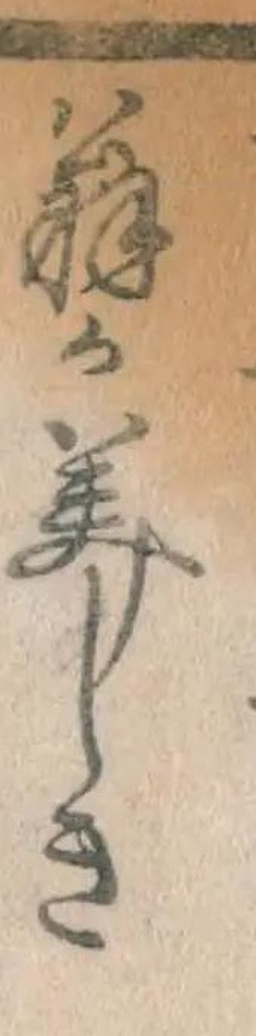翁か美しき
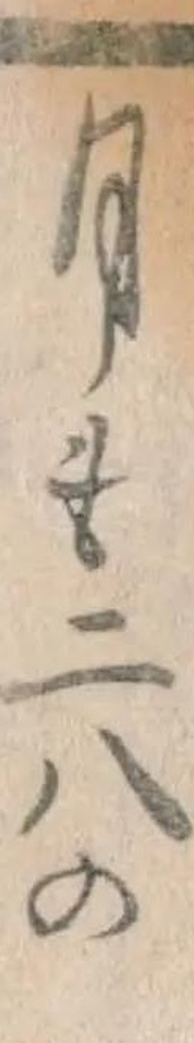月も二八の
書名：絵本物見岡
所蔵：国立国会図書館 National Diet Library, JAPAN
